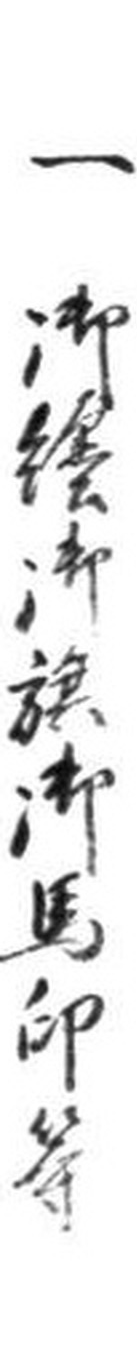一御絵御旗御馬印等
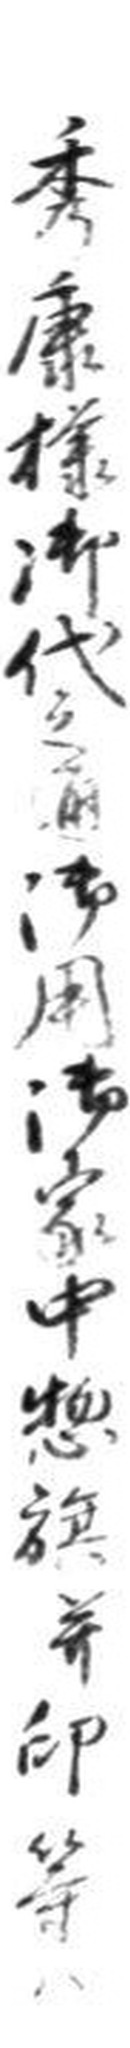秀康様御代之通御用御家中惣旗并印等ハ
